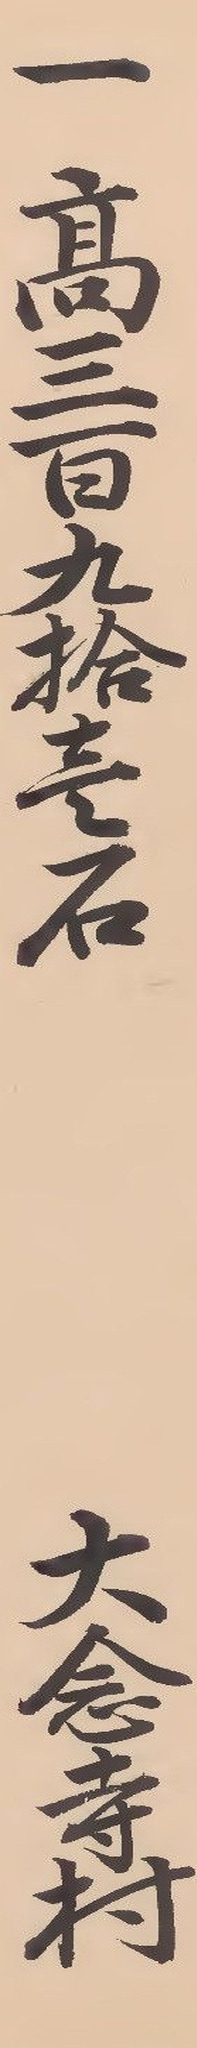一高三百九拾壱石大念寺村
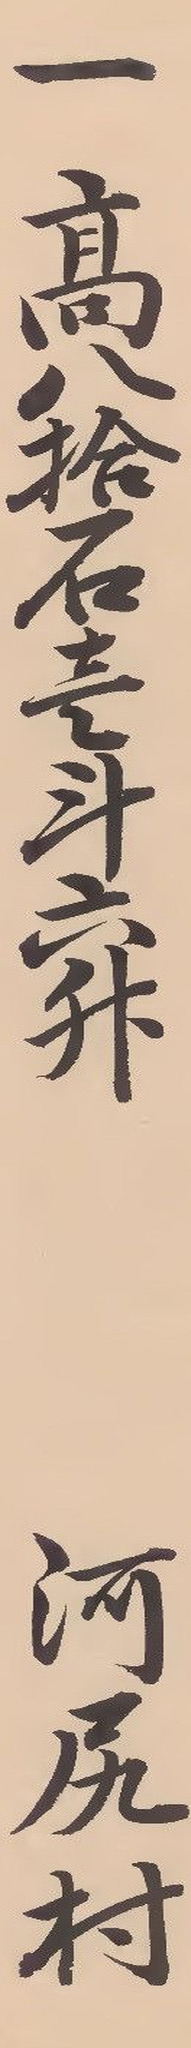一高八拾石壱斗六升河尻村
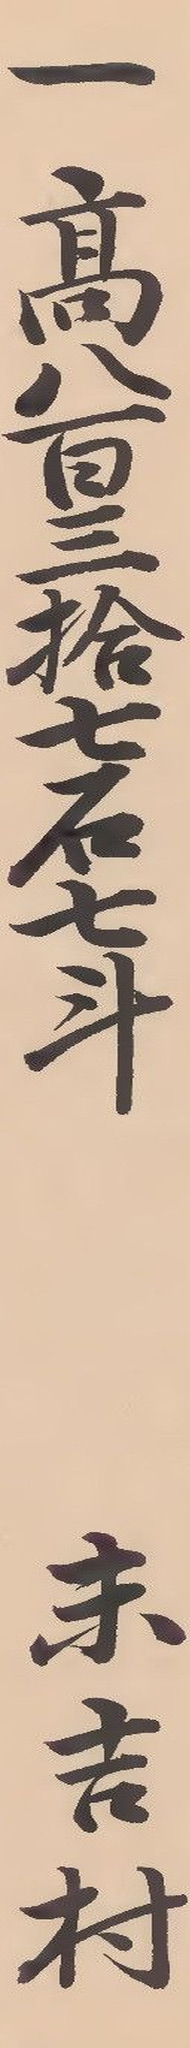一高八百三拾七石七斗末吉村
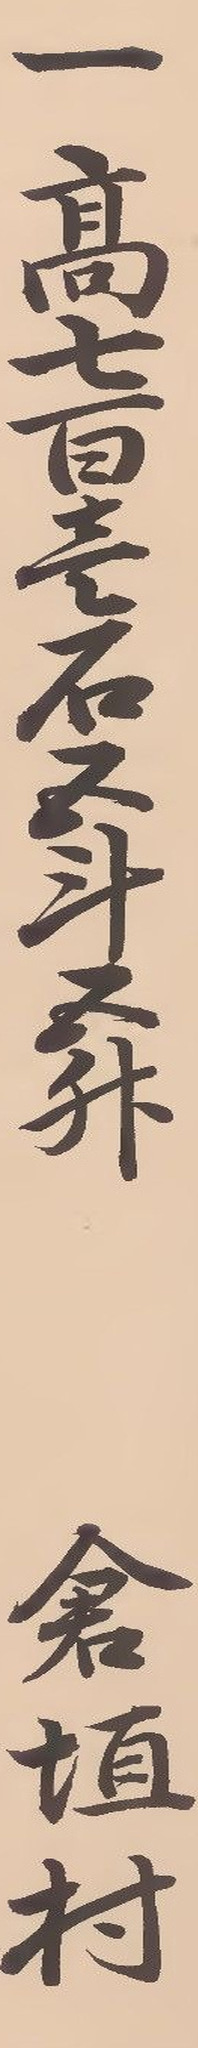一高七百壱石五斗五升倉垣村
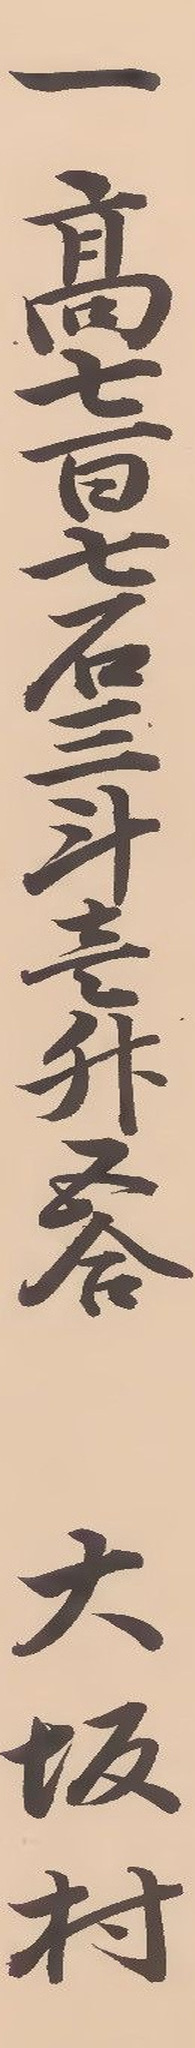一高七百七石三斗壱升五合大坂村
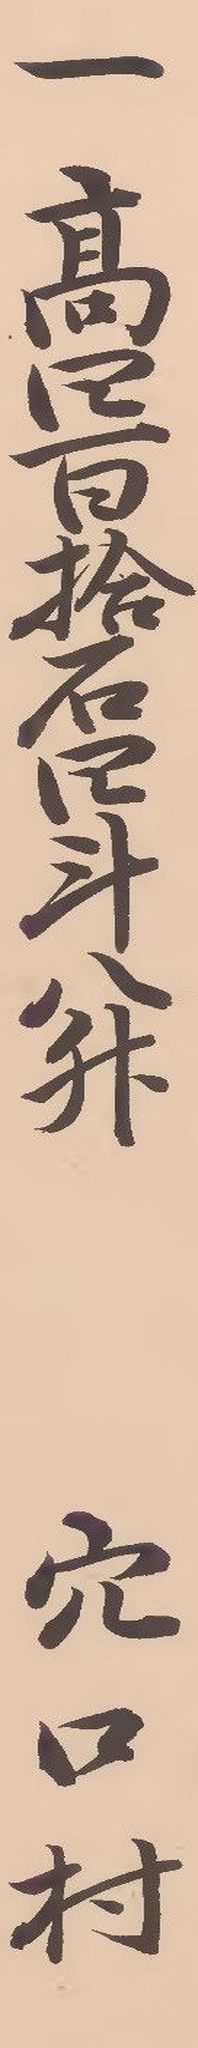一高四百拾石四斗八升穴口村

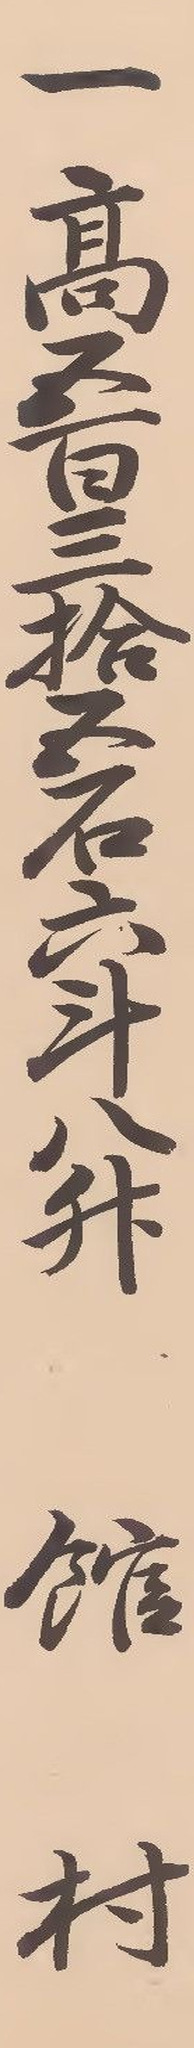一高五百三拾五石六斗八升館村
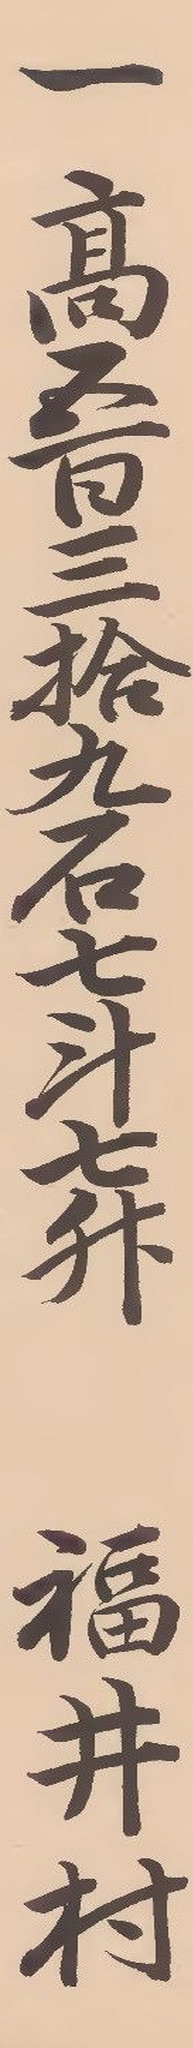一高五百三拾九石七斗七升福井村
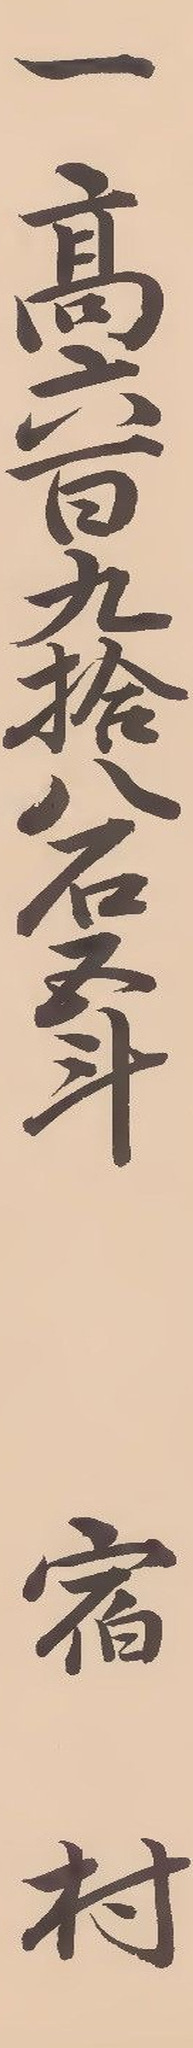一高六百九拾八石五斗宿村
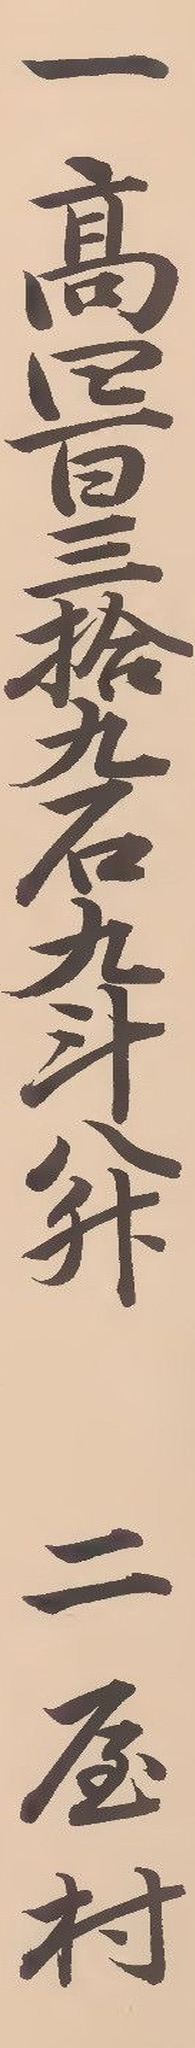一高四百三拾九石九斗八升二屋村
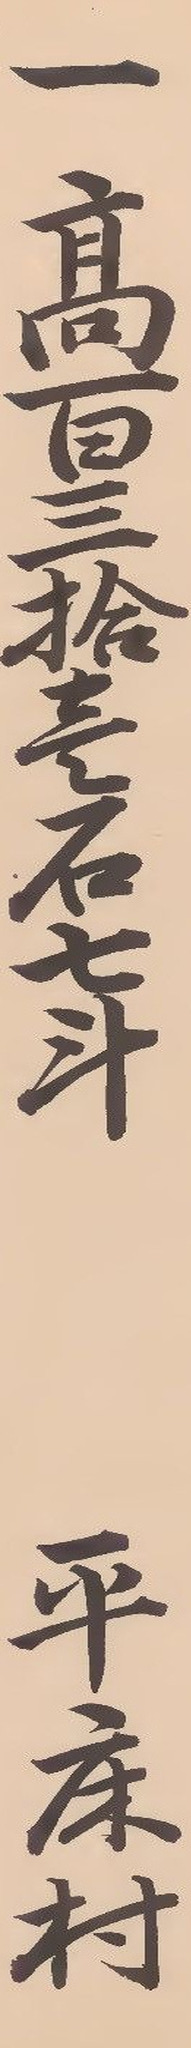一高百三拾壱石七斗平床村
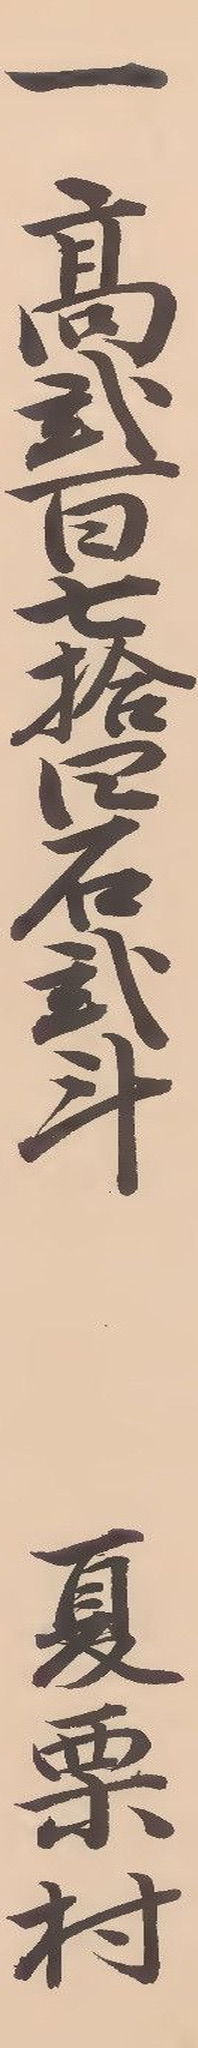一高弐百七拾四石弐斗夏栗村
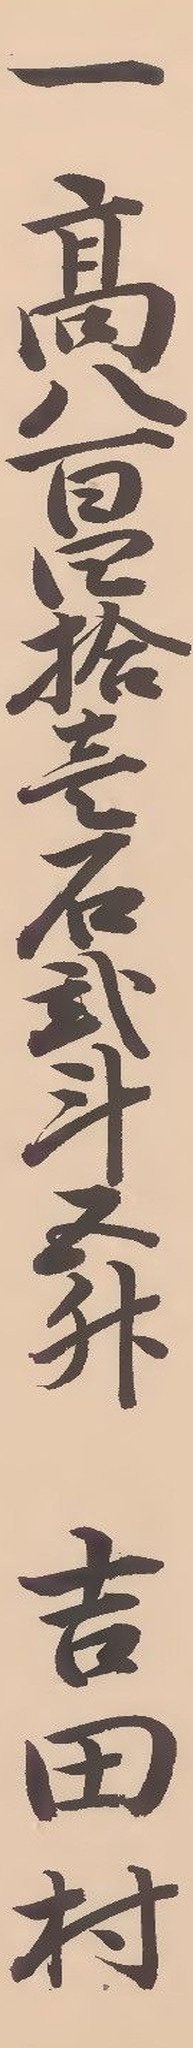一高八百四拾壱石弐斗五升吉田村

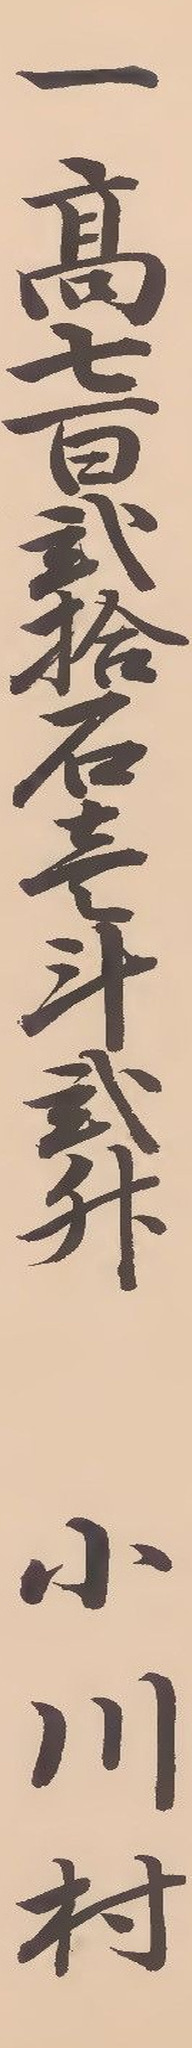一高七百弐拾石壱斗弐升小川村
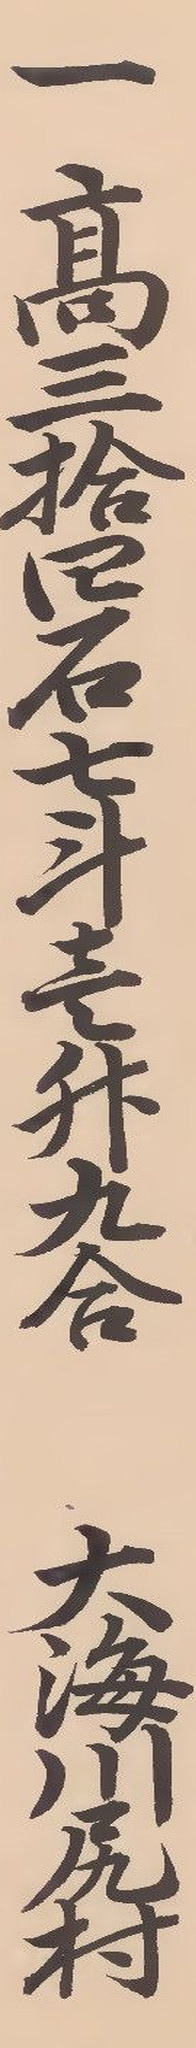一高三拾四石七斗壱升九合大海川尻村
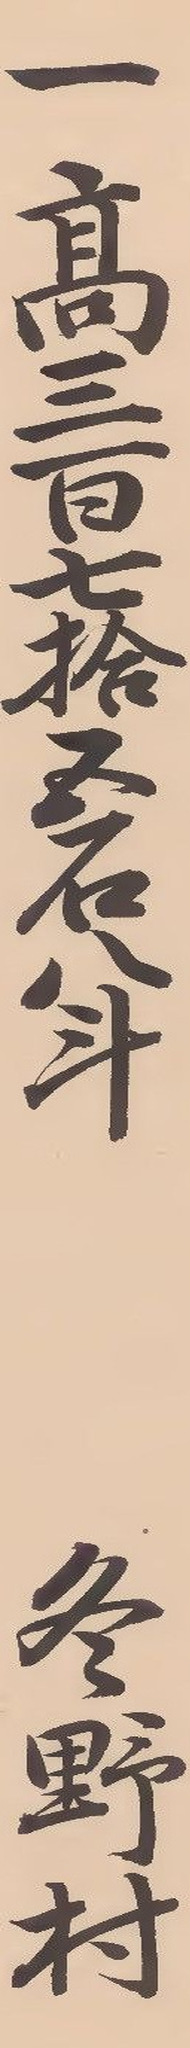一高三百七拾五石八斗冬野村
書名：能登国郷帳
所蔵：国立公文書館 National Archives of Japan
